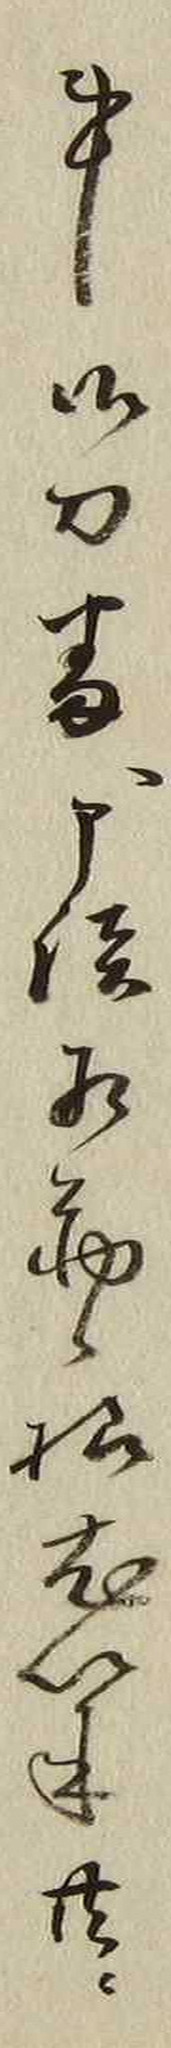事御刀番へ申談相勤候様尤以来共ニ
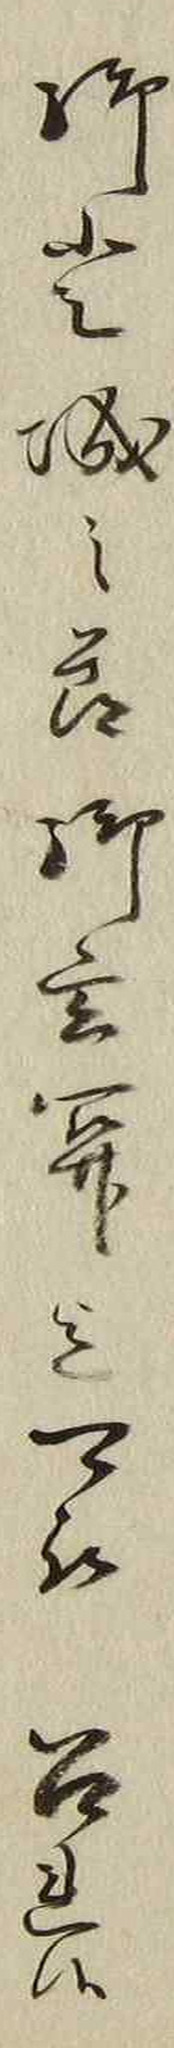御登城之節御玄開迄可被召連候
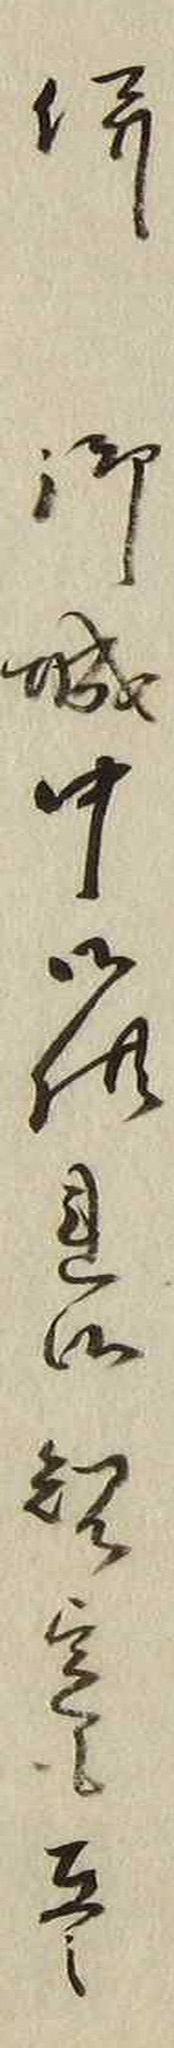併御城中御供連候規定も在之
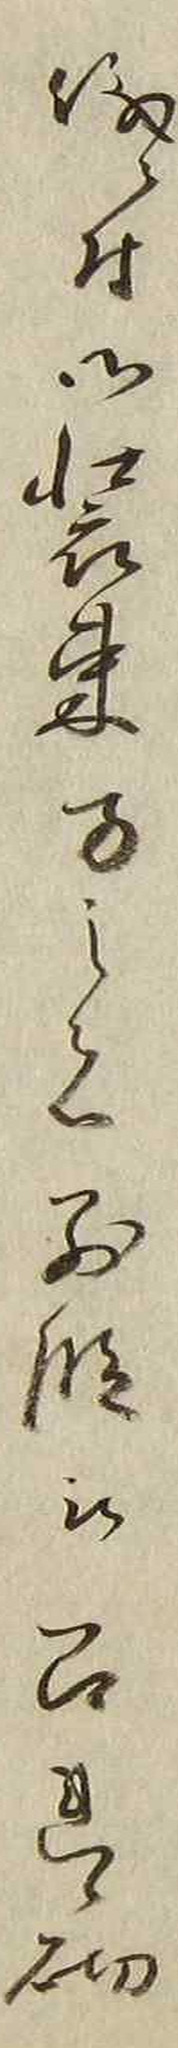儀ニ付御装束方之者別段被召連候砌
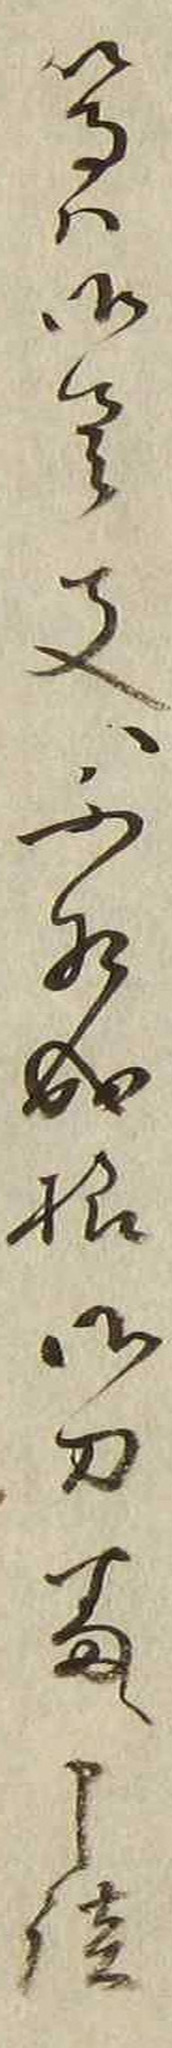等ハ御差支不相成様御刀番へ申談

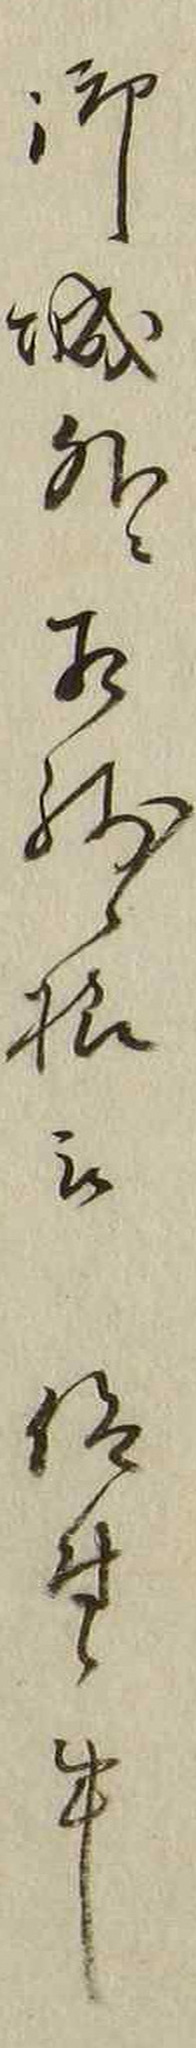御城外ニ相残候様被仰付候事
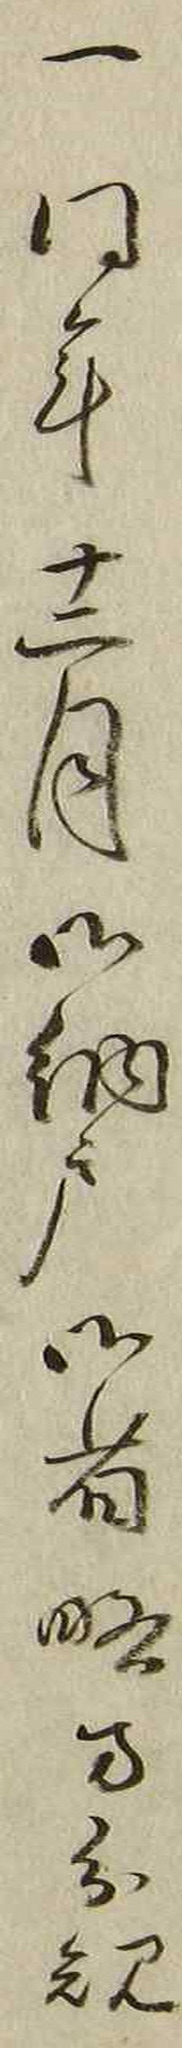一同年十二月御納戸御省略方分規
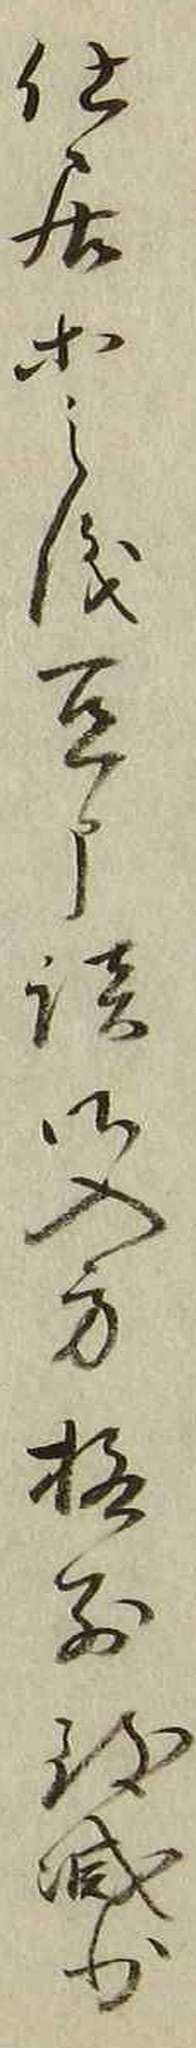仕居等之儀宜申談御入方格別致減少
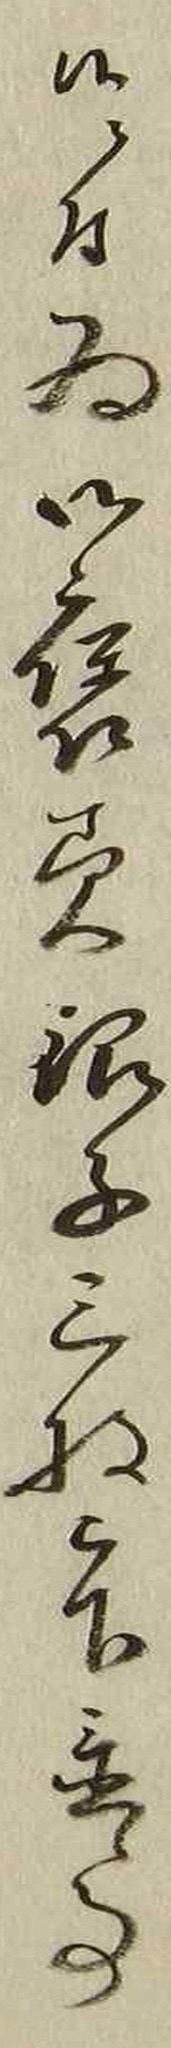候ニ付為御褒美銀子三枚被下置候事
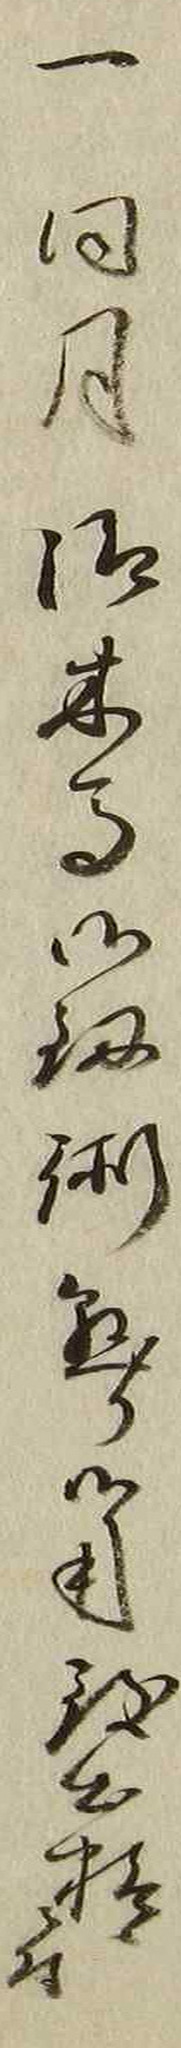一同月御木馬御剣術懸り御用致出精候ニ付
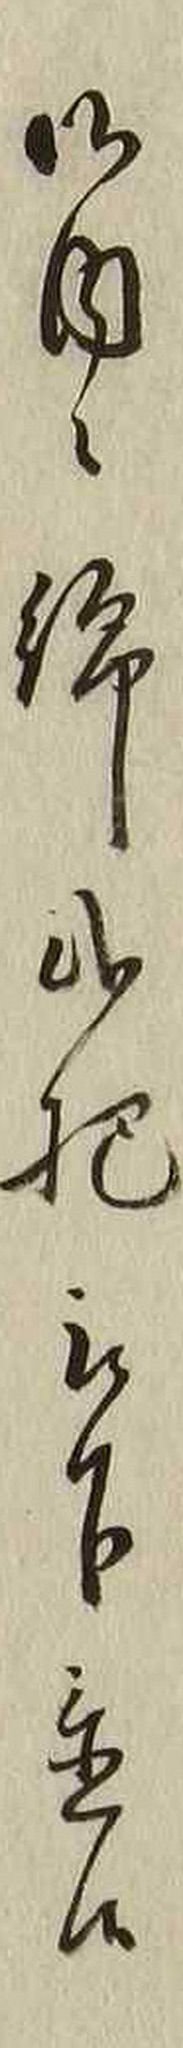御内々綿弐把被下置候
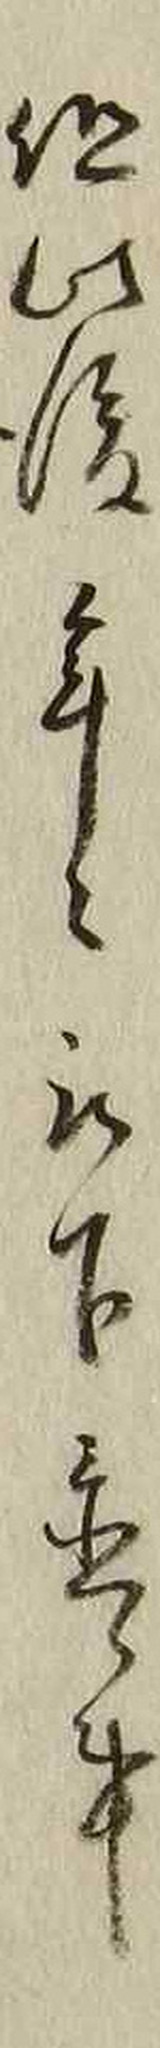但此後年々被下置候事
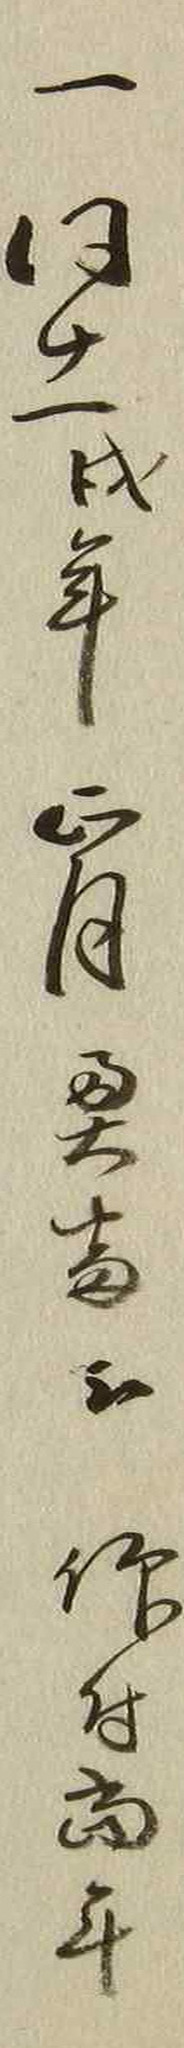一同十一戌年正月奥番被仰付当年
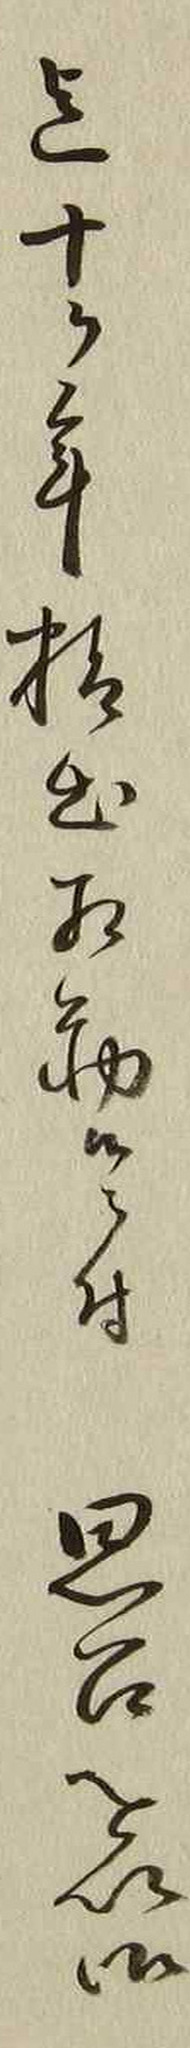迄十ケ年精出相勤候ニ付思召を以御
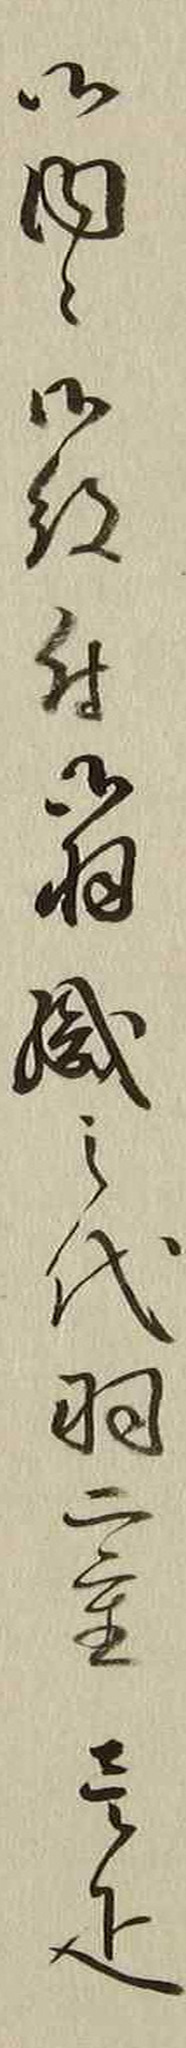御内々御紋付御羽織之代羽二重壱疋
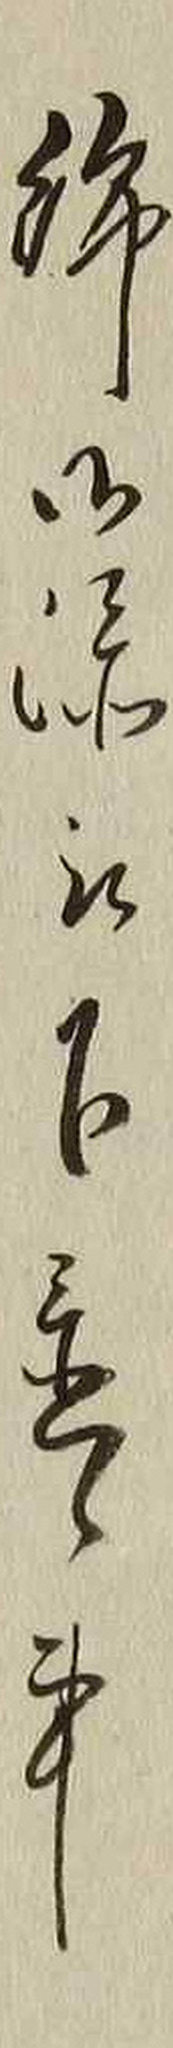綿御添被下置候事
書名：諸士系譜　巻之25　い之部25
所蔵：会津若松市立会津図書館
